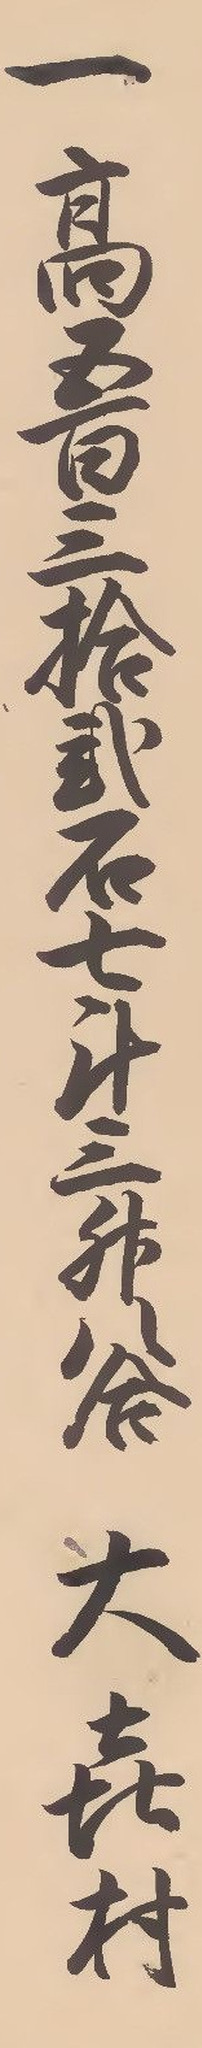一高五百三拾弐石七斗三升八合大喜村
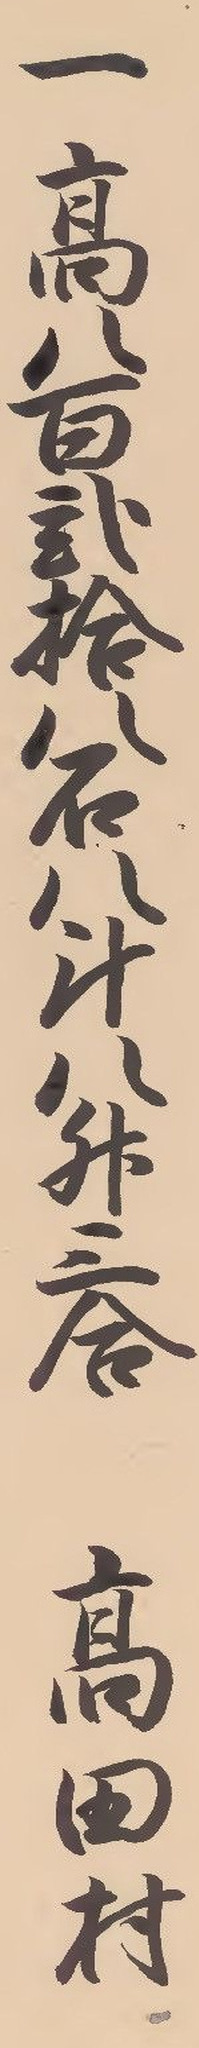一高八百弐拾八石八斗八升三合高田村
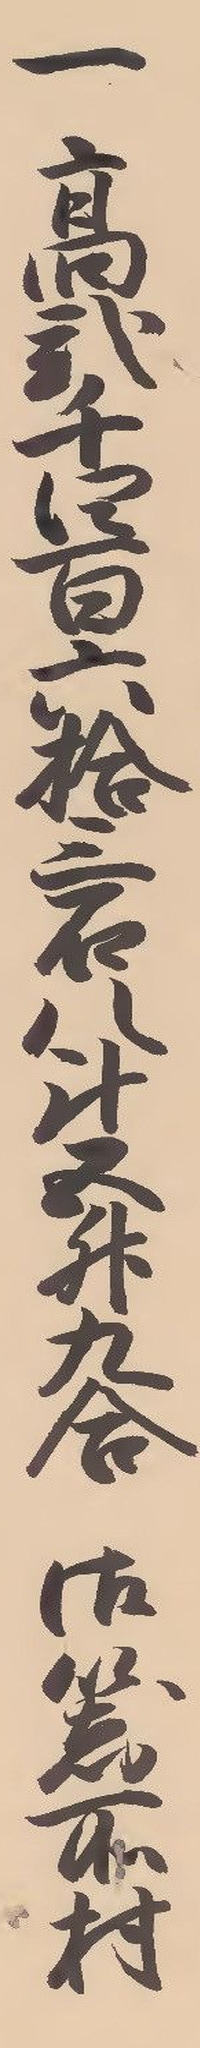一高弐千四百六拾三石八斗五升九合御器所村
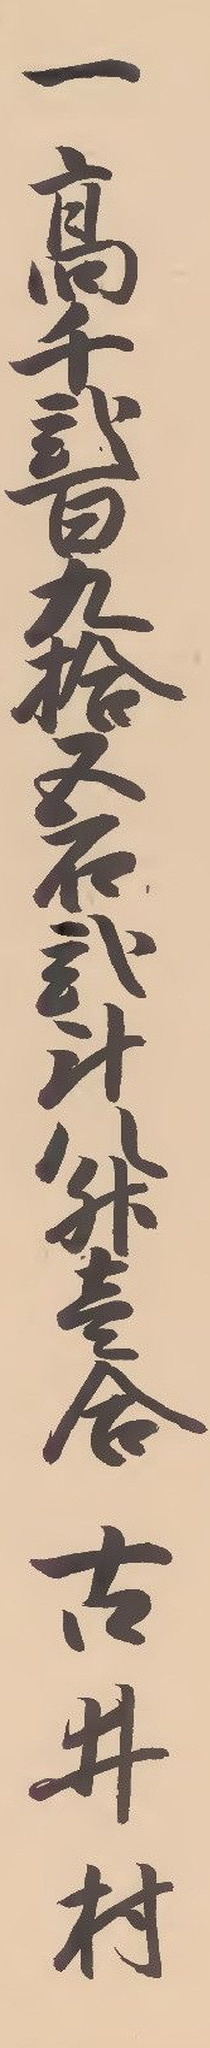一高千弐百九拾五石弐斗八升壱合古井村
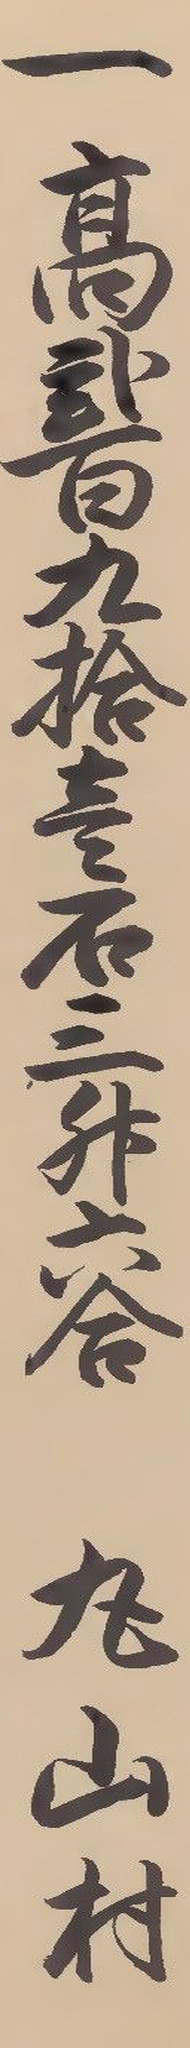一高弐百九拾壱石三升六合丸山村
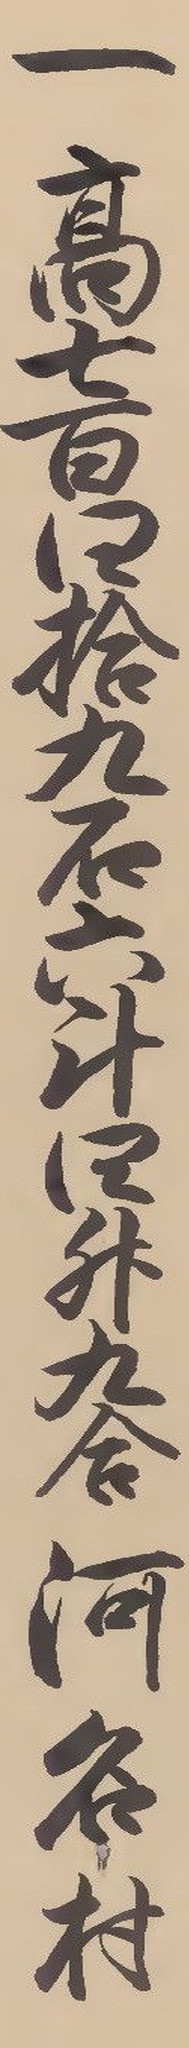一高七百四拾九石六斗四升九合河名村
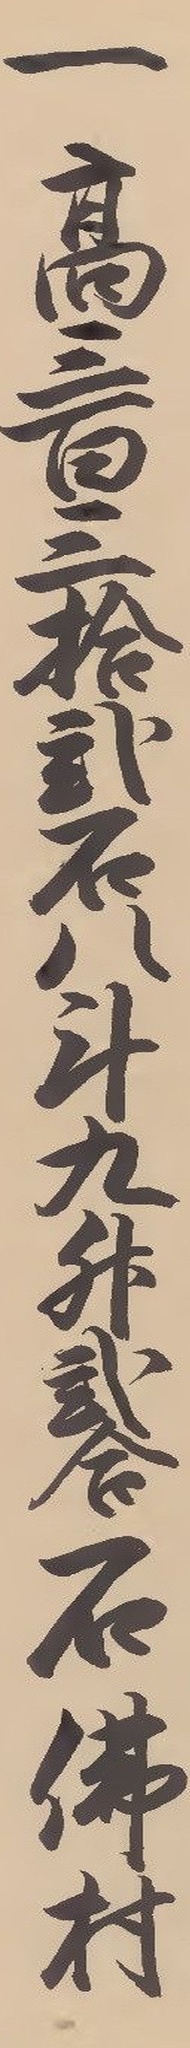一高三百三拾弐石八斗九升弐合石仏村

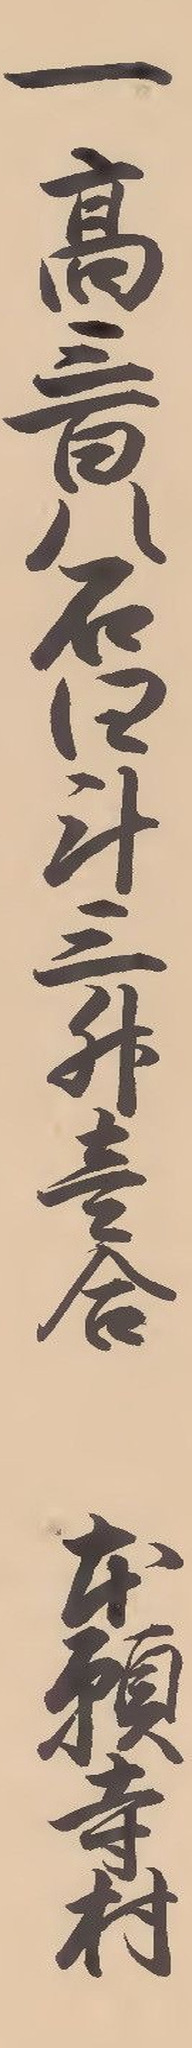一高三百八石四斗三升壱合本願寺村
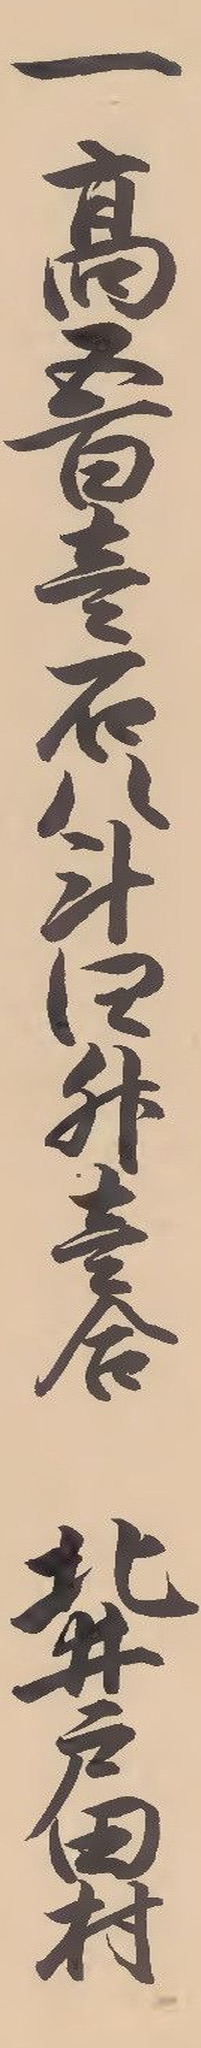一高五百壱石八斗四升壱合北井戸田村
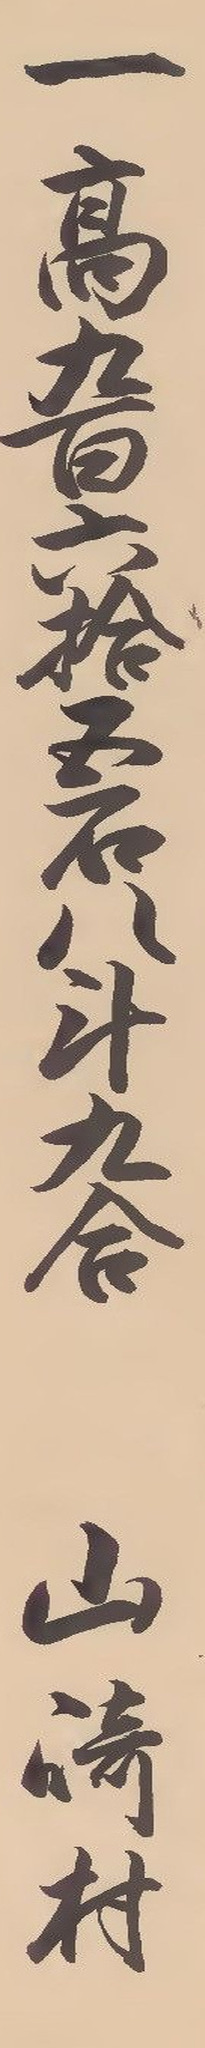一高九百六拾五石八斗九合山崎村
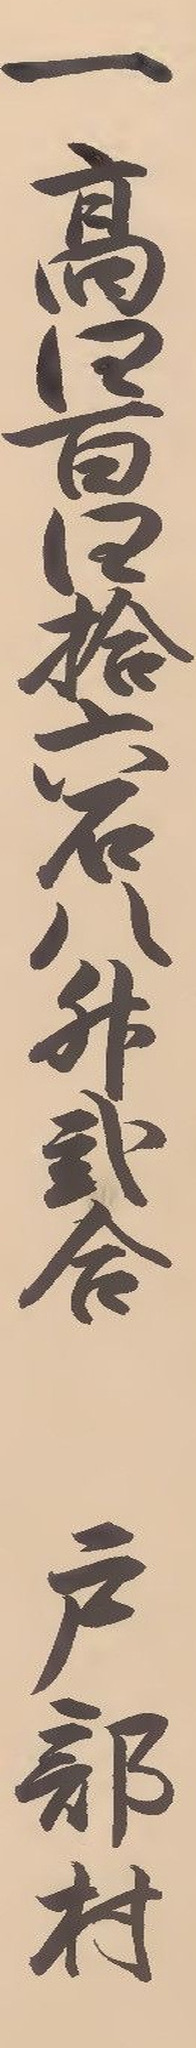一高四百四拾六石八升弐合戸部村
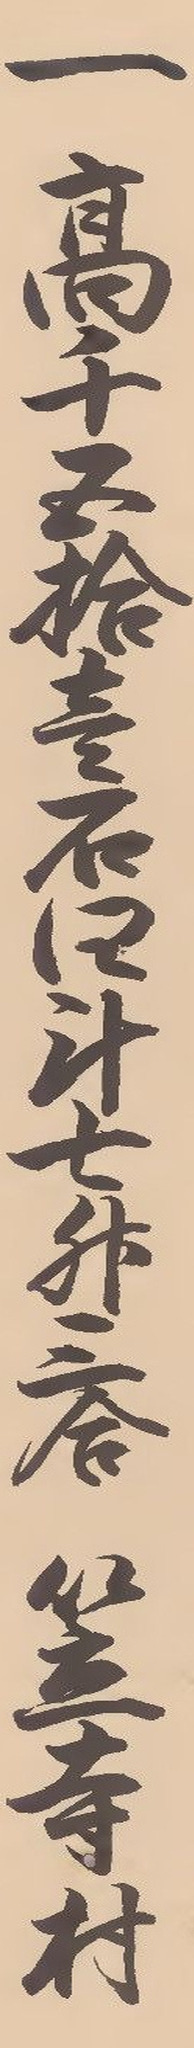一高千五拾壱石四斗七升三合笠寺村

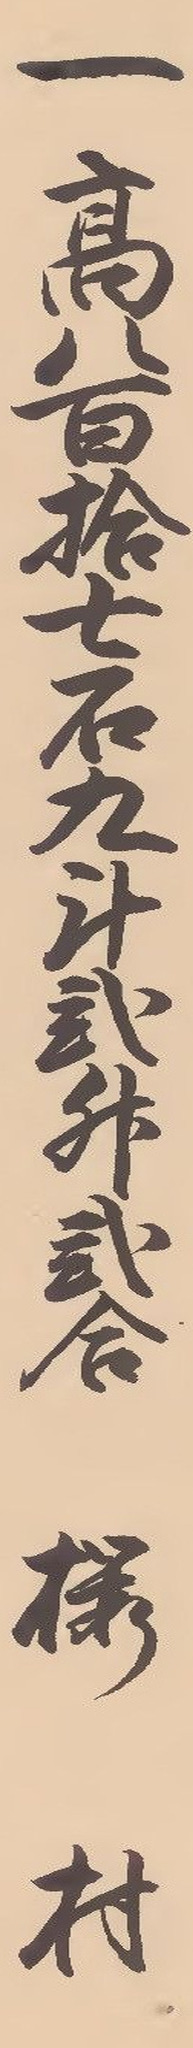一高八百拾七石九斗弐升弐合桜村
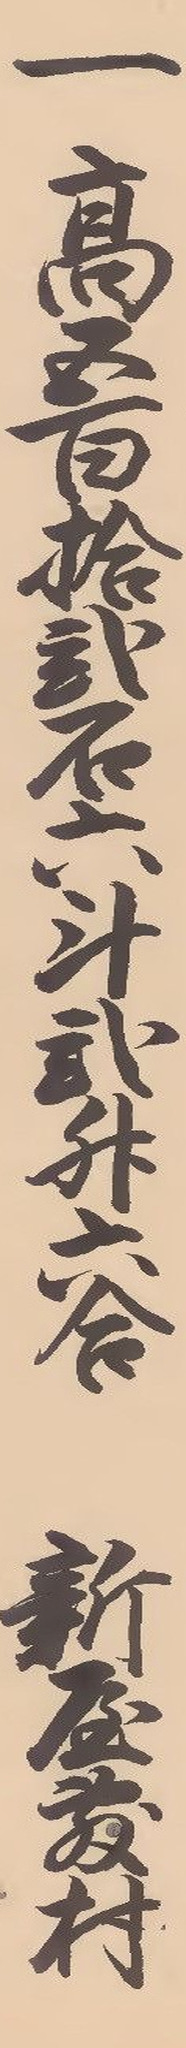一高五百拾弐石六斗弐升六合新屋敷村
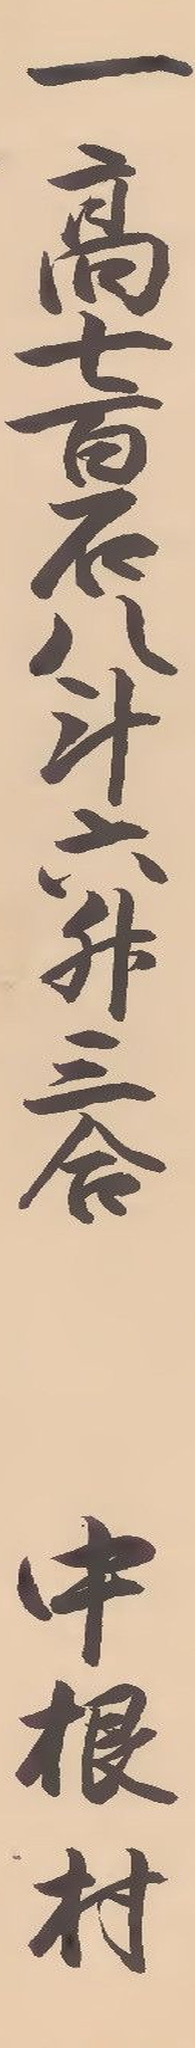一高七百石八斗六升三合中根村
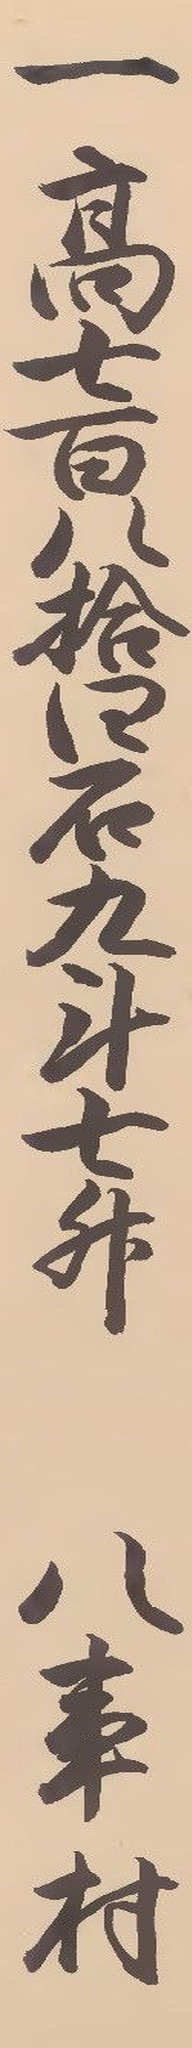一高七百八拾四石九斗七升八事村
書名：尾張国郷帳
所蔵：国立公文書館 National Archives of Japan
